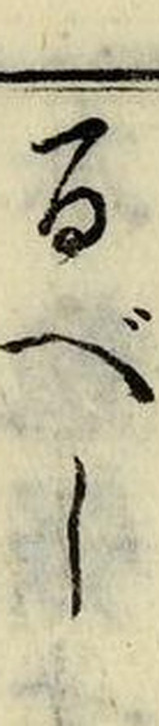るべし
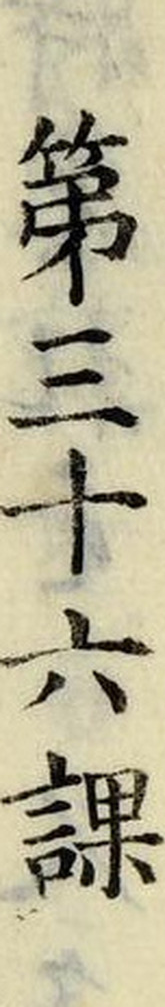第三十六課
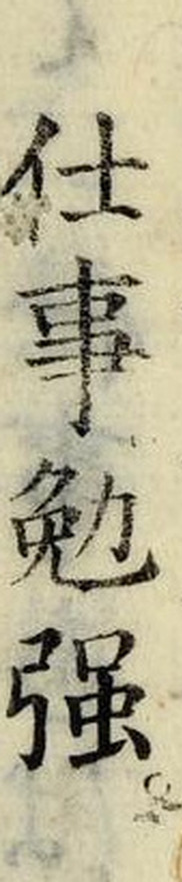仕事。勉強。

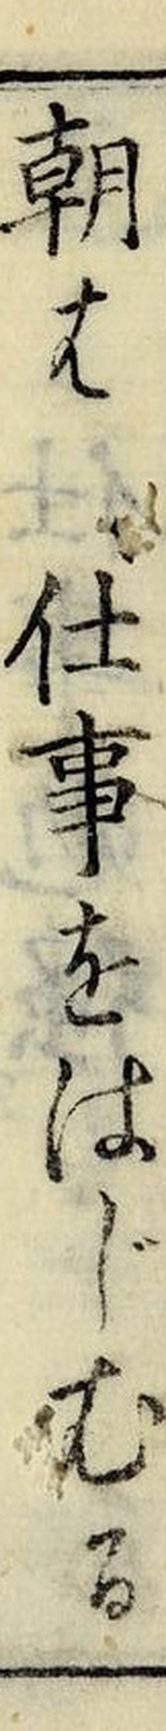朝は仕事をはじむる
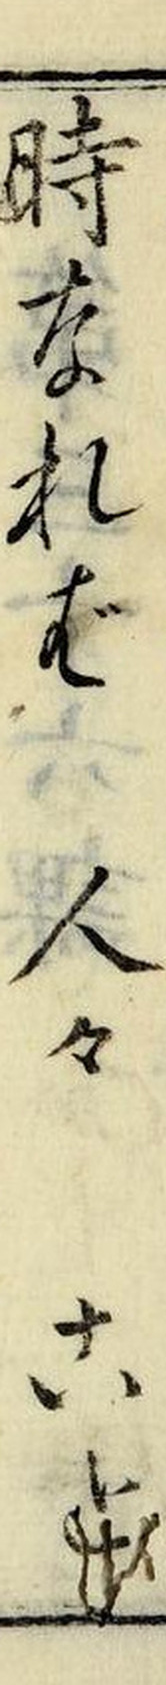時なれば人々こと
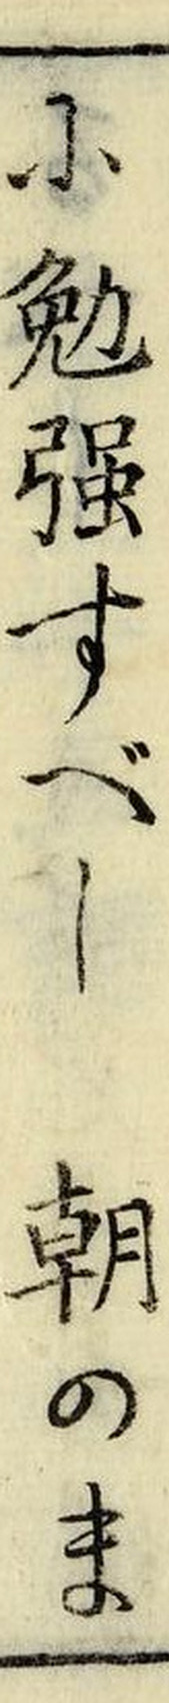に勉強すべし朝のま
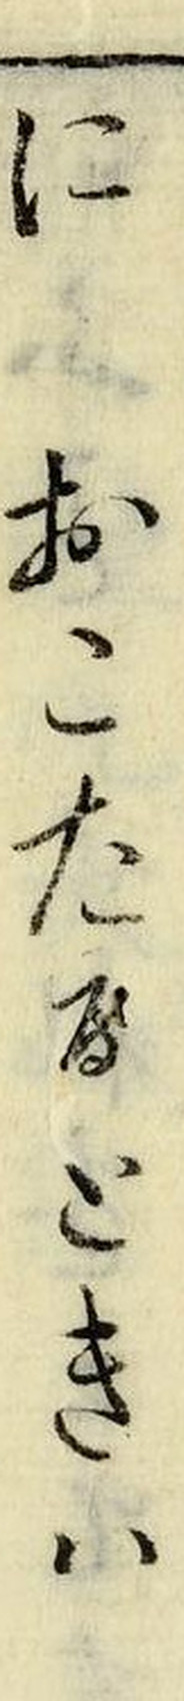におこたるときは
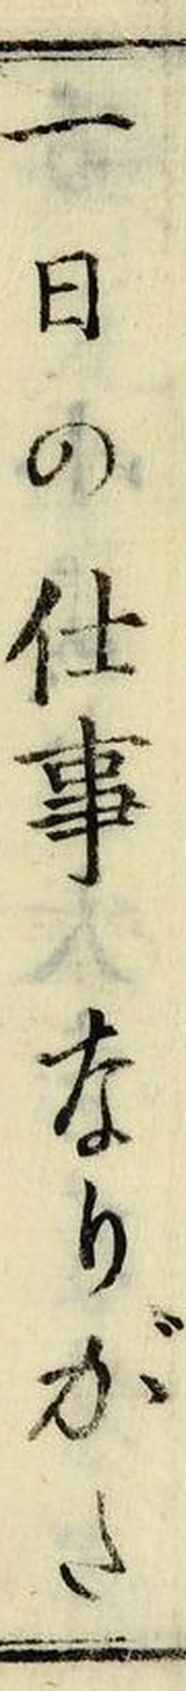一日の仕事なりがた
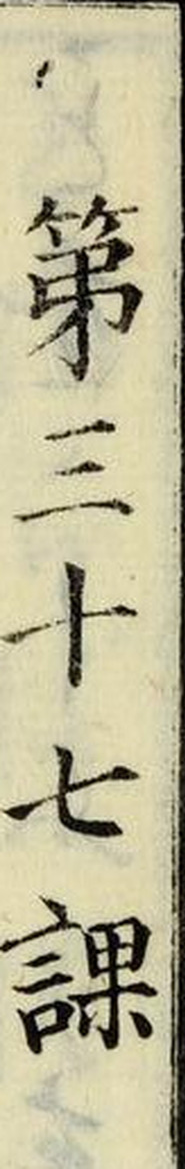第三十七課
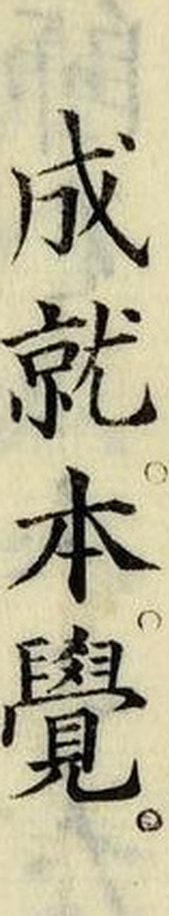成就。本。覚。
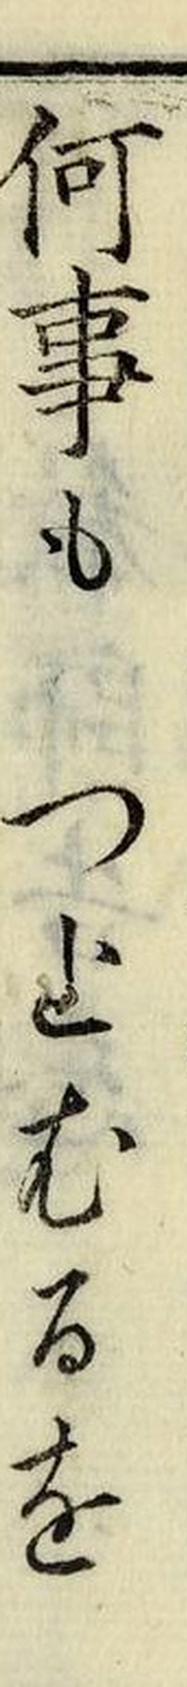何事もつとむるを
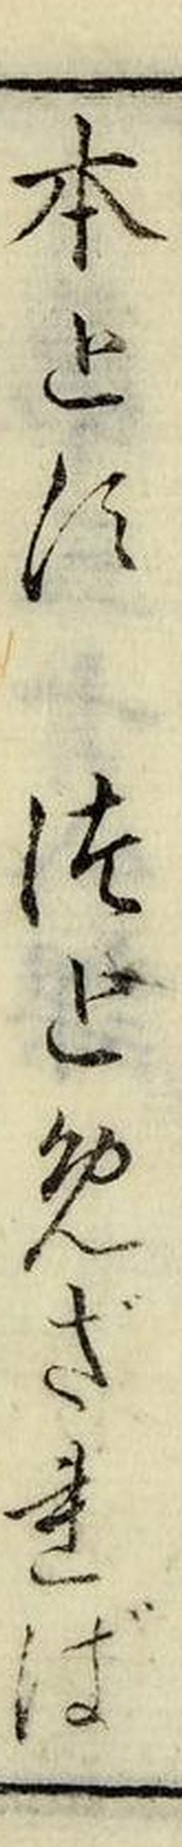本とすつとめざれば
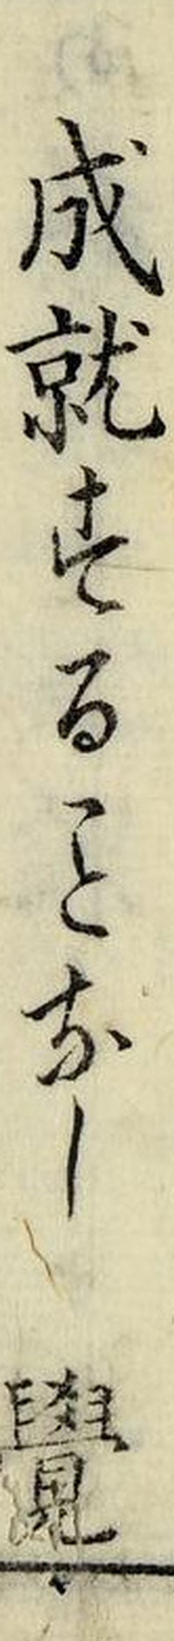成就することなし覚
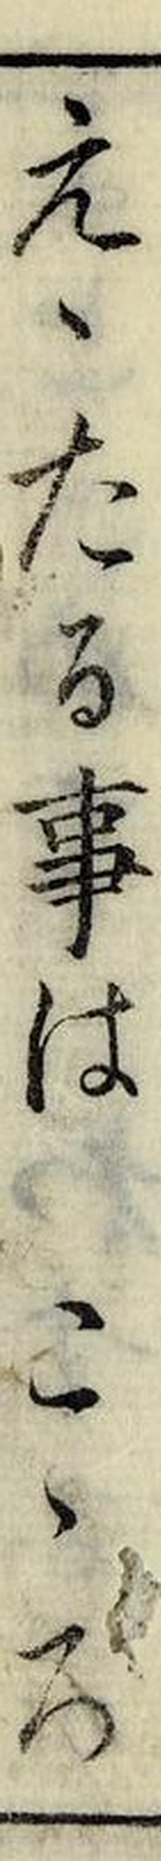えゝたる事はこゝろ

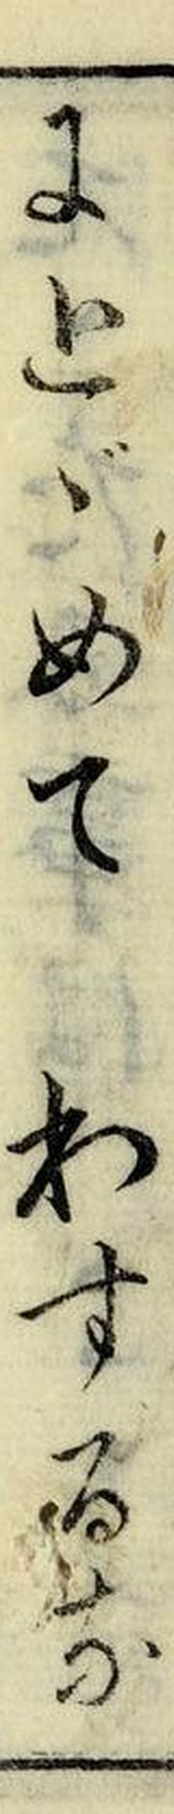にとゞめてわするな
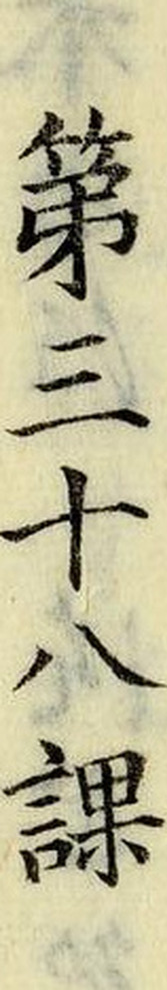第三十八課
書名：小学読本 初等科 巻一
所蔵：福井県文書館 Fukui Prefectural Archives
